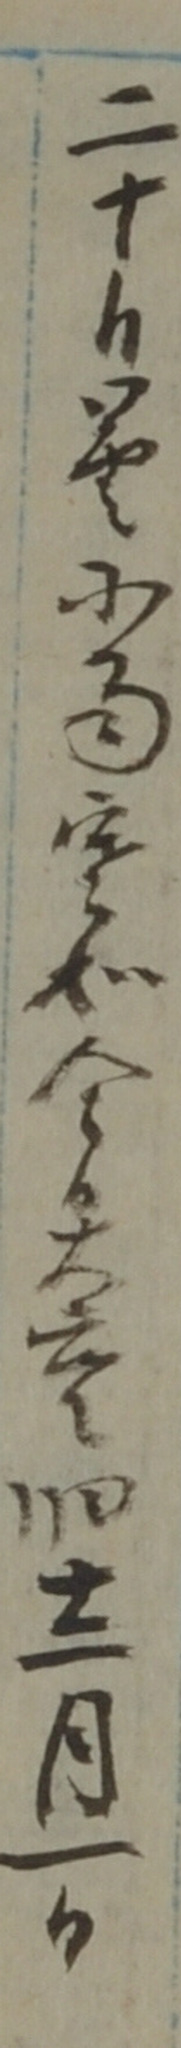二十日曇小雨寒和今日大寒旧十二月一日
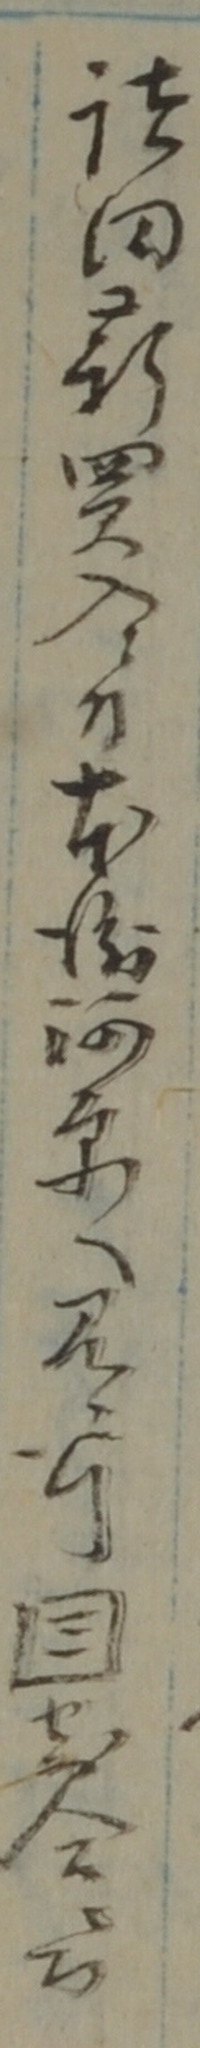諸田薪買入ニ付本衛河原ヘ見ニ行寄合ニ而
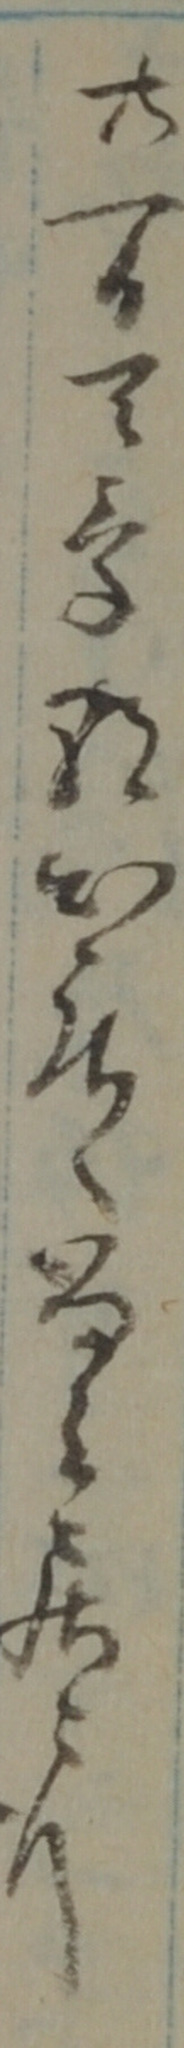廿一日天気朝出居候留守居に行
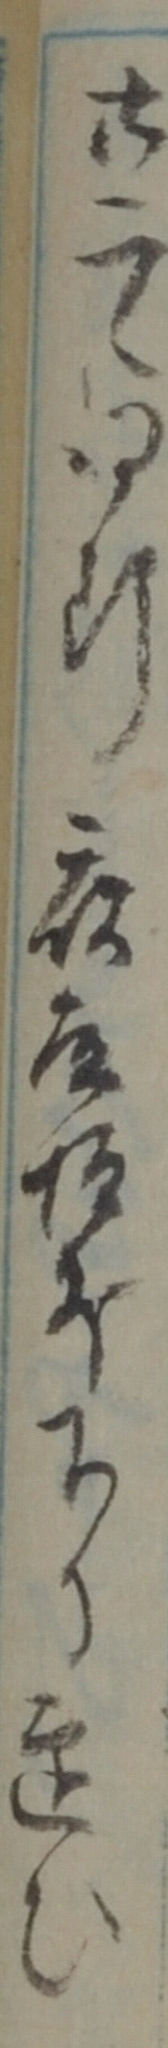廿二日同断夜故坂本下リ迎ひ
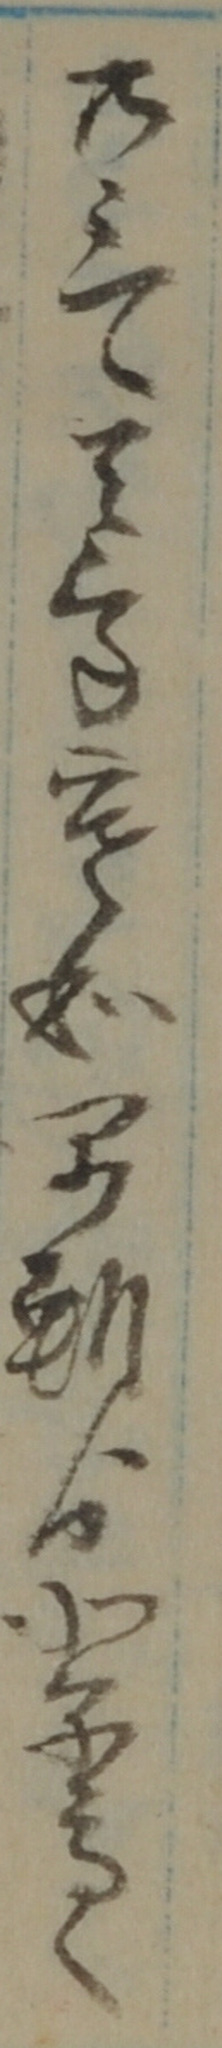廿三日天気寒和早朝ゟ北原亭ヘ
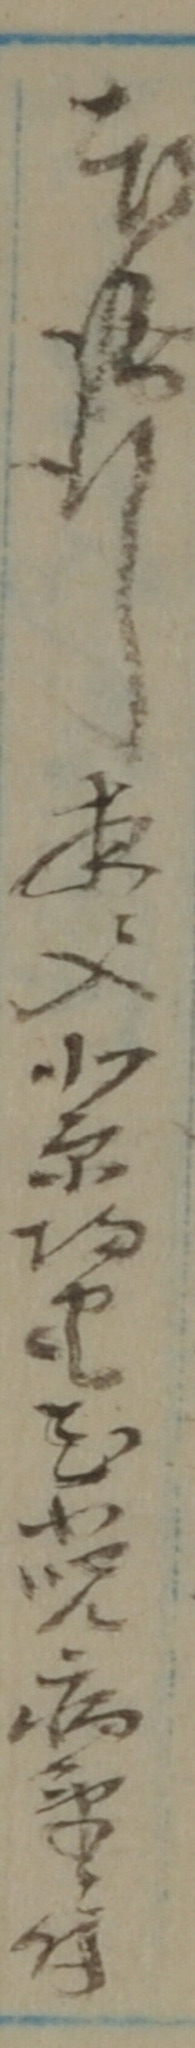本衛行候夜ニ入北原帰宅尤小児病気ニ付
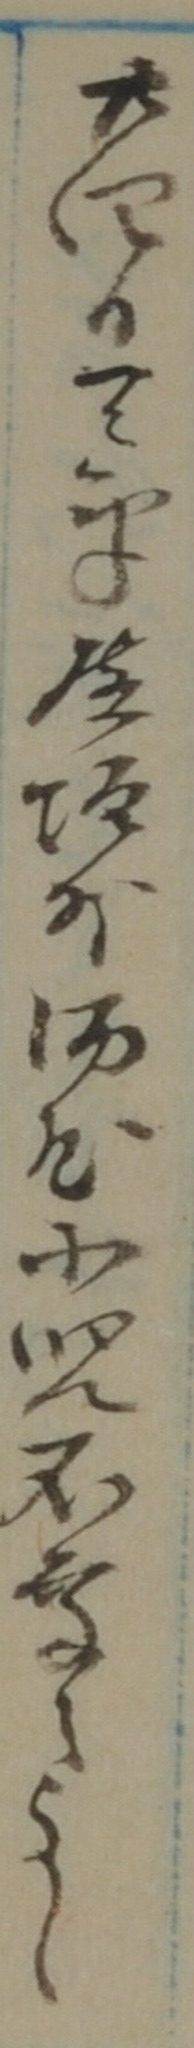廿四日天気殿垣外酒屋小児不受候よし
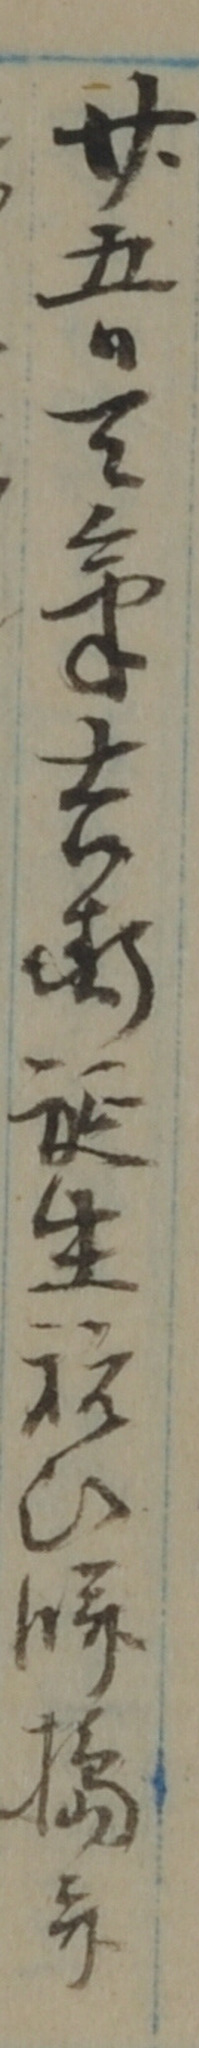廿五日天気吉衛誕生祝ひ餅搗并
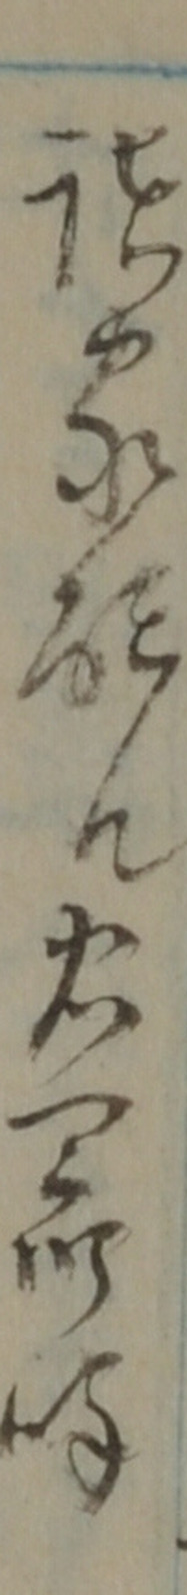諸家配ル忠一郎呼
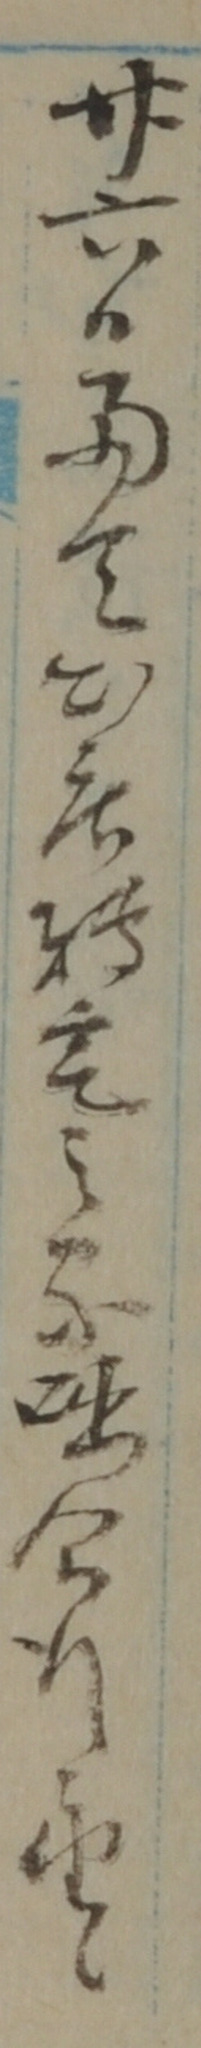廿六日雨天出居転宅之家咄合行届候
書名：機械製糸所日記
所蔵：伊那市立高遠町図書館・合同会社AMANE
